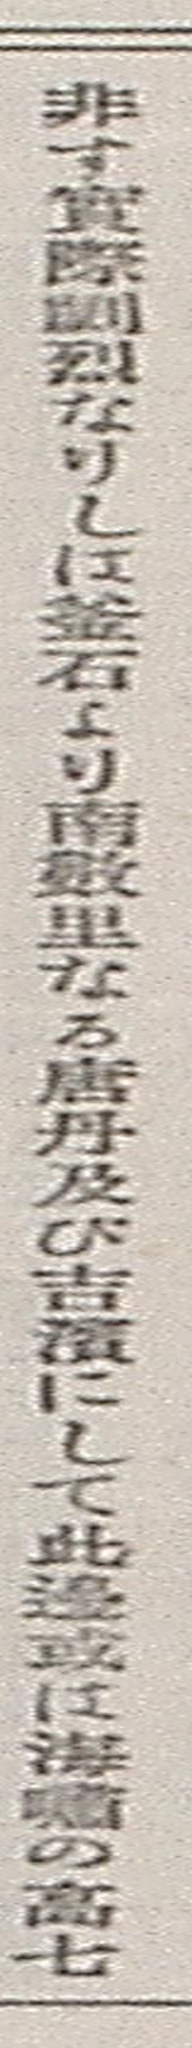非ず実際劇烈なりしは釜石より南数里なる唐丹及び吉浜にして此辺或は海嘯の高七
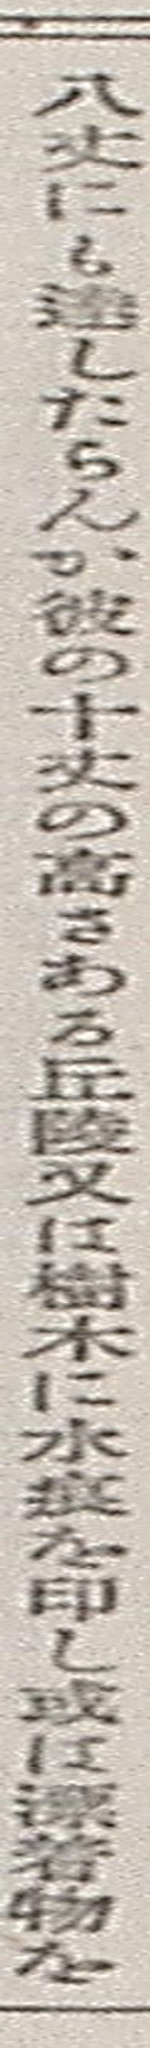八丈にも達したらんか彼の十丈の高さある丘陵又は樹木に水痕を印し或は漂着物を
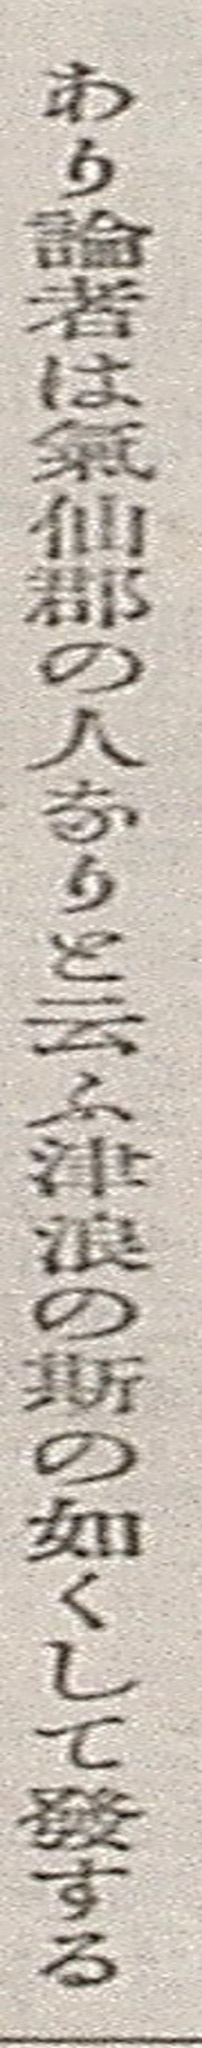あり論者は気仙郡の人なりと云ふ津浪の斯の如くして発する
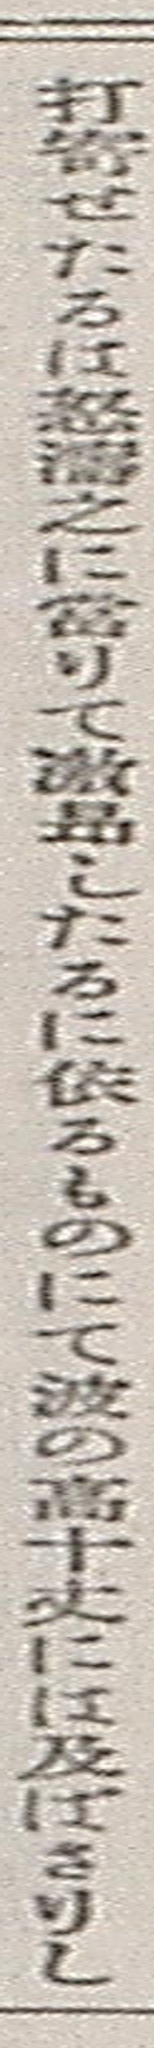打寄せたるは怒濤之に当りて激昂したるに依るものにて波の高十丈には及ばさりし
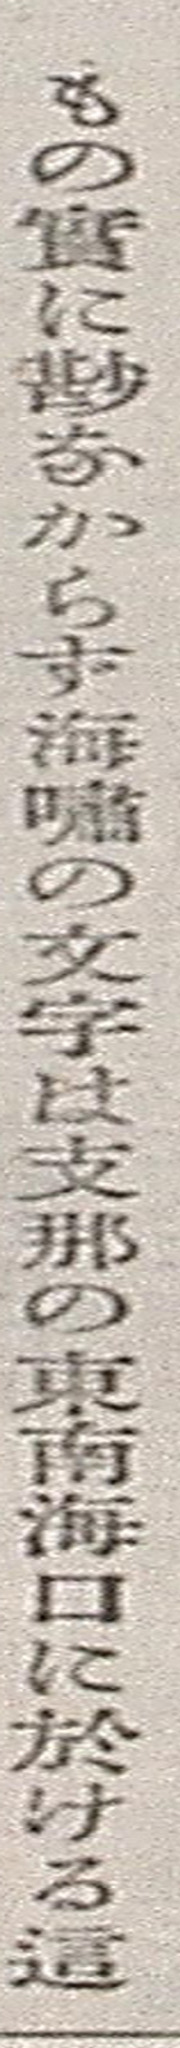もの実に尠なからず海嘯の文字は支那の東南海口に於ける這
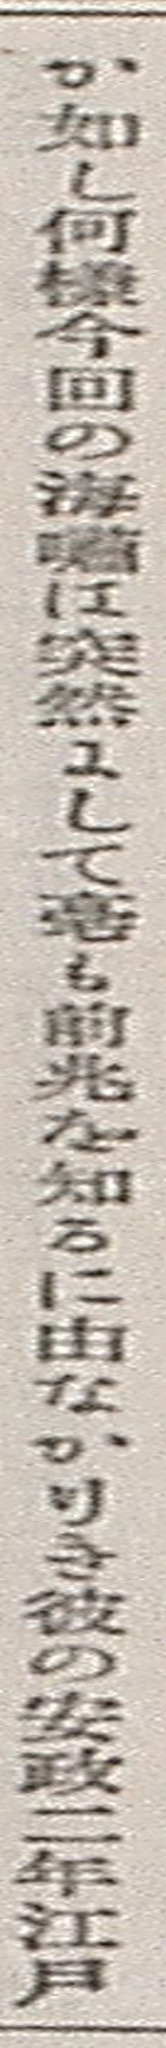か如し何様今回の海嘯は突然にして毫も前兆を知るに由なかりき彼の安政二年江戸
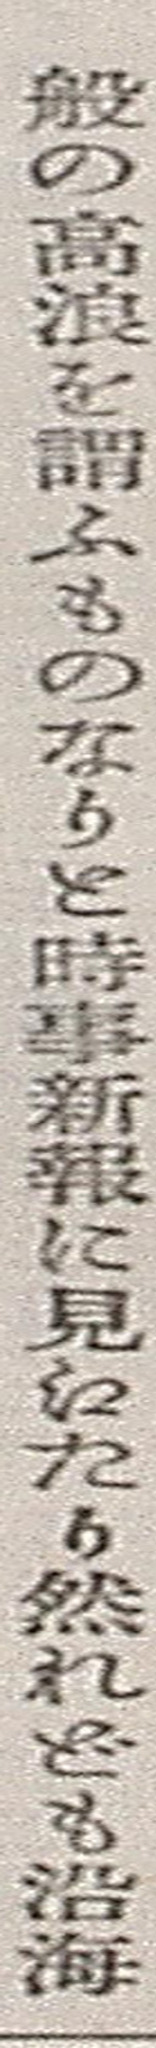般の高浪を謂ふものなりと時事新報に見えたり然れども沿海
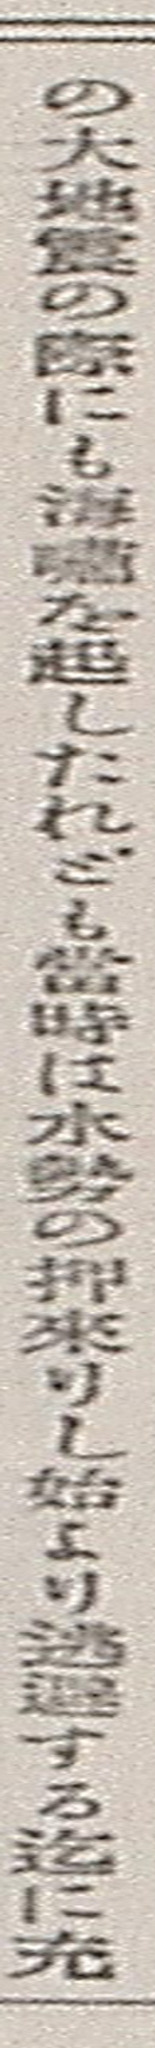の大地震の際にも海嘯を起したれども当時は水勢の押来りし始より逃避する迄に充
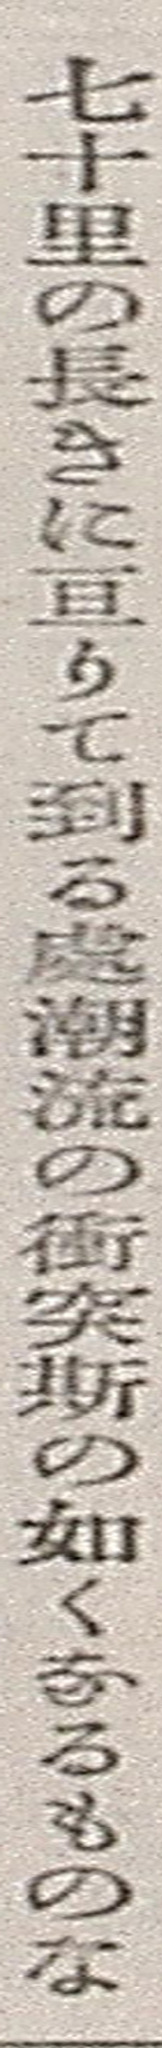七十里の長きに亘りて到る処潮流の衝突斯の如くなるものな
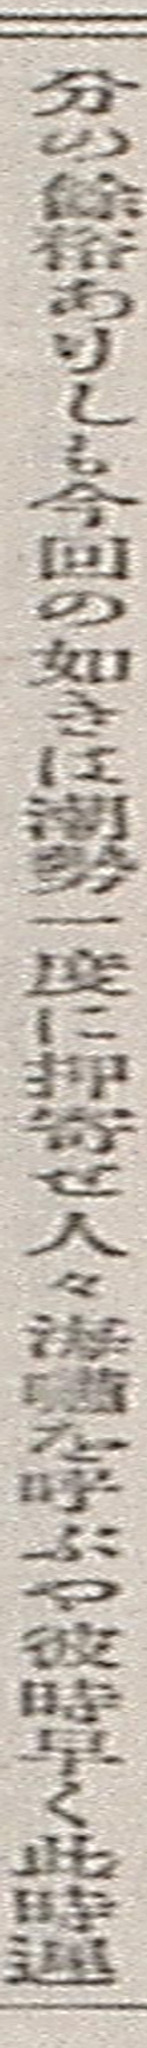分の余裕ありしも今回の如きは潮勢一度に押寄せ人々海嘯を呼ぶや彼時早く此時遅
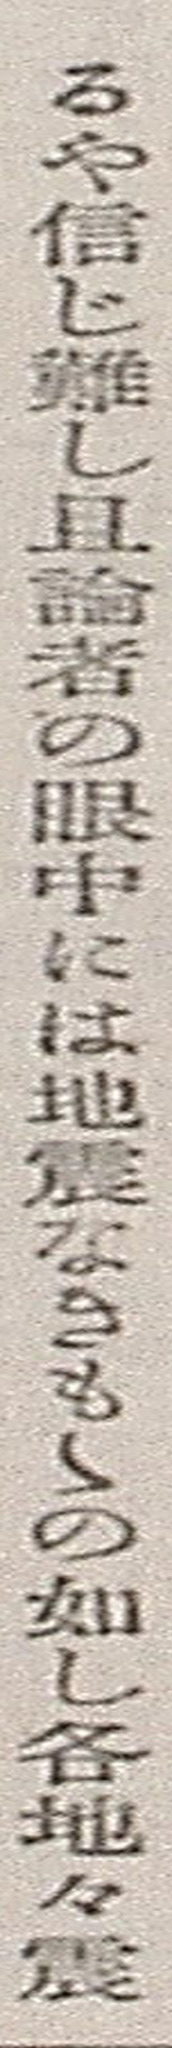るや信じ難し且論者の眼中には地震なきものゝ如し各地々震
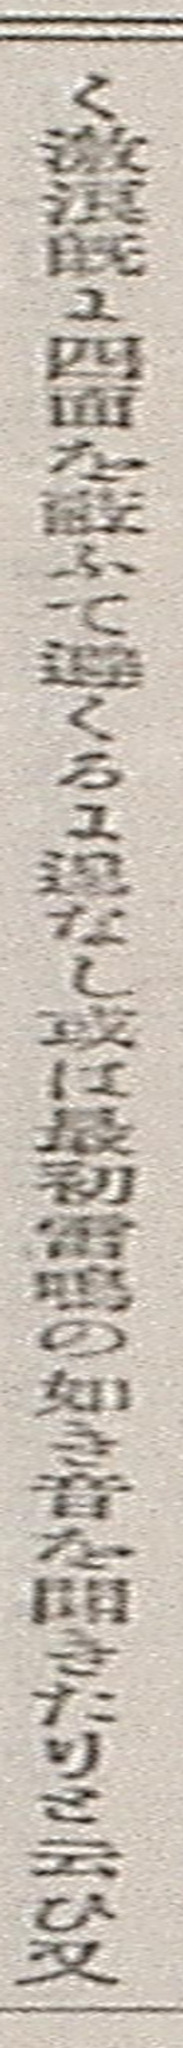く激浪既に四面を蔽ふて避くるに遑なし或は最初雷鳴の如き音を聞きたりと云ひ又
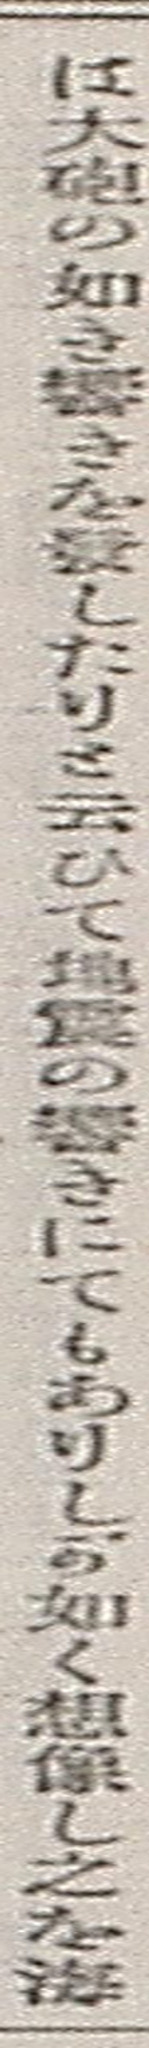は大砲の如き響きを発したりと云ひて地震の響きにてもありしが如く想像し之を海
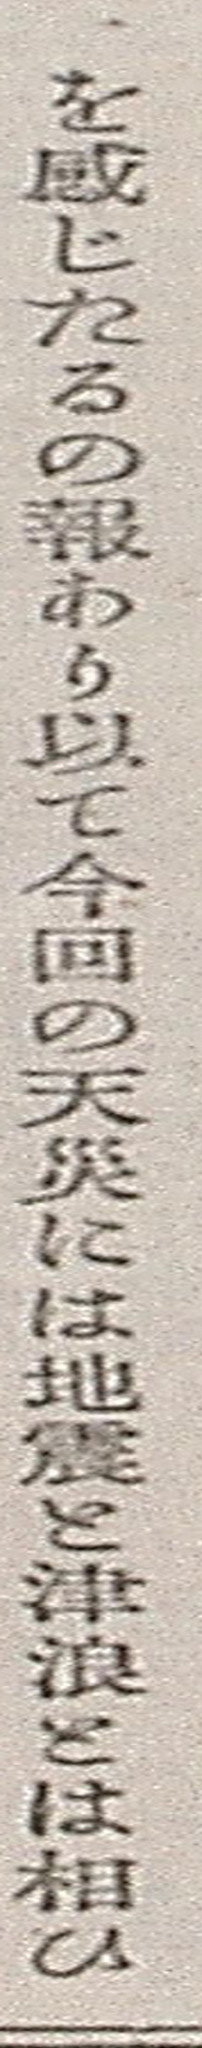を感じたるの報あり以て今回の天災には地震と津浪とは相ひ
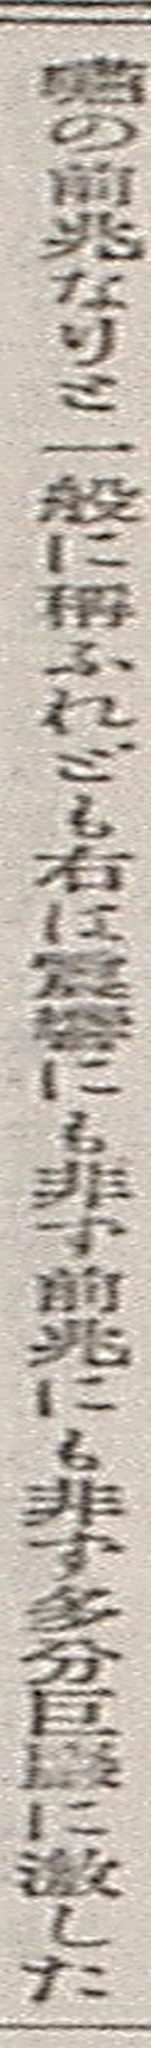嘯の前兆なりと一般に称ふれども右は震響にも非ず前兆にも非ず多分巨巌に激した
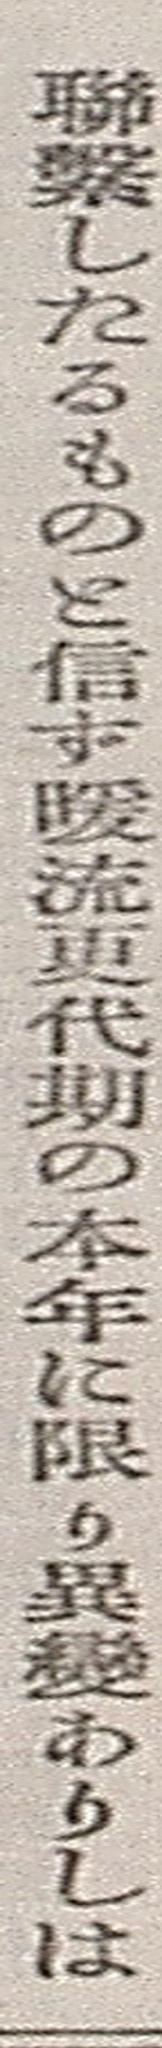連繋したるものと信ず暖流更代期の本年に限り異変ありしは
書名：風俗畫報臨時増刊第百十九號　大海嘯被害録（中）
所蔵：東京大学地震研究所図書室 Earthquake Research Institute Library, The University of Tokyo, JAPAN
